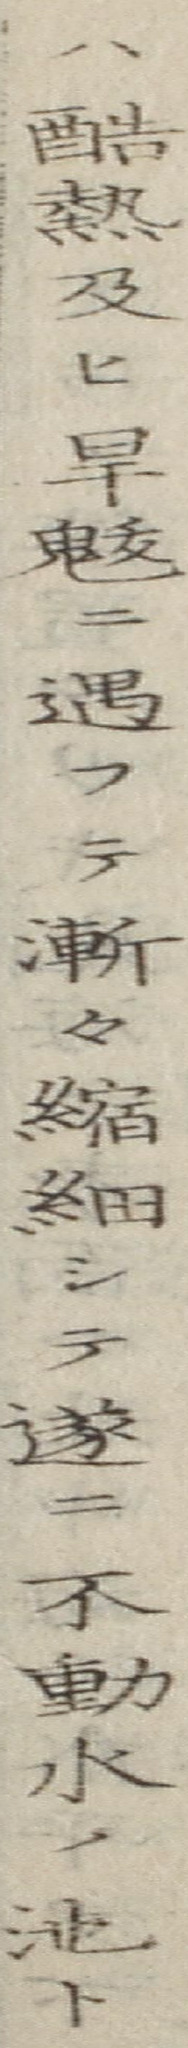ハ酷熱及ヒ早魃ニ遇フテ漸々縮細シテ遂ニ不動水ノ池ト
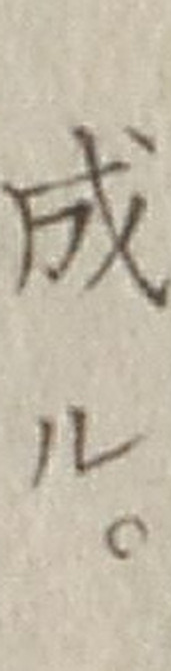成ル。
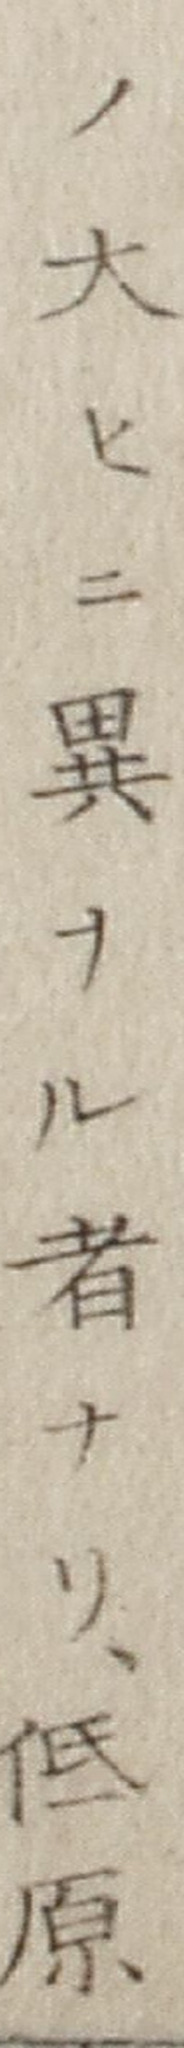ノ大ヒニ異ナル者ナリ、低原
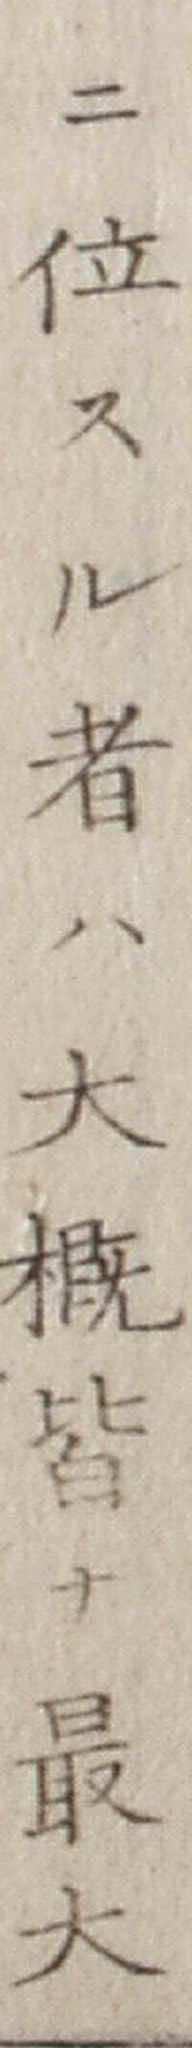ニ位スル者ハ大概皆ナ最大
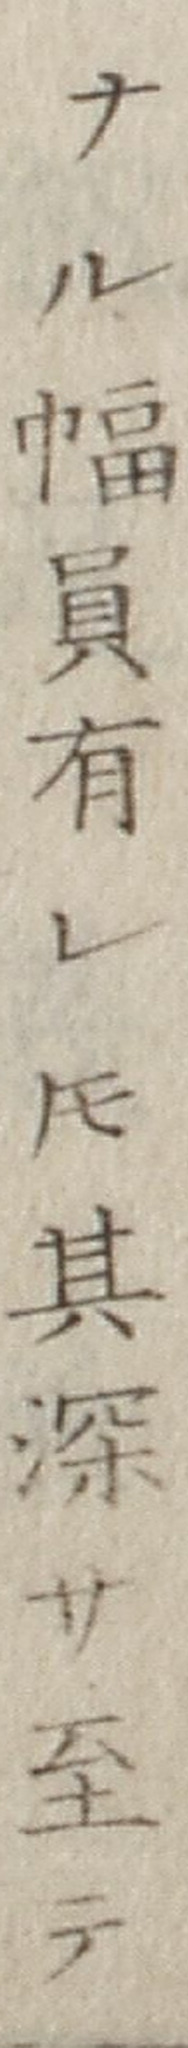ナル幅員有レトモ其深サ至テ
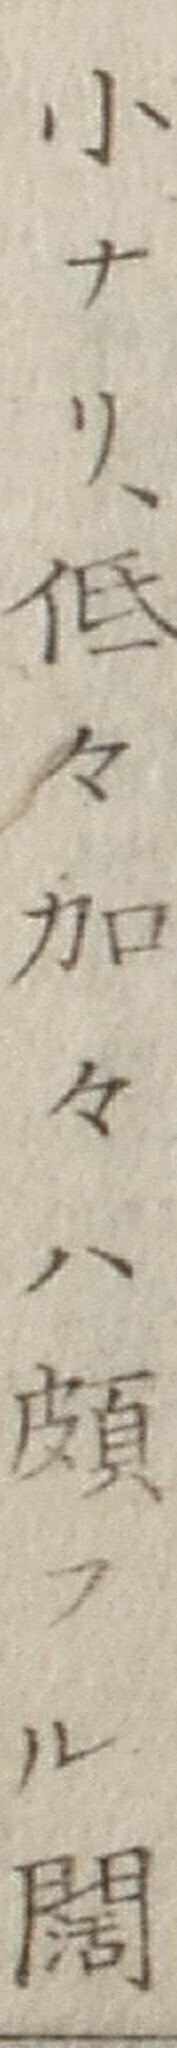小ナリ、低々加々ハ頗フル闊
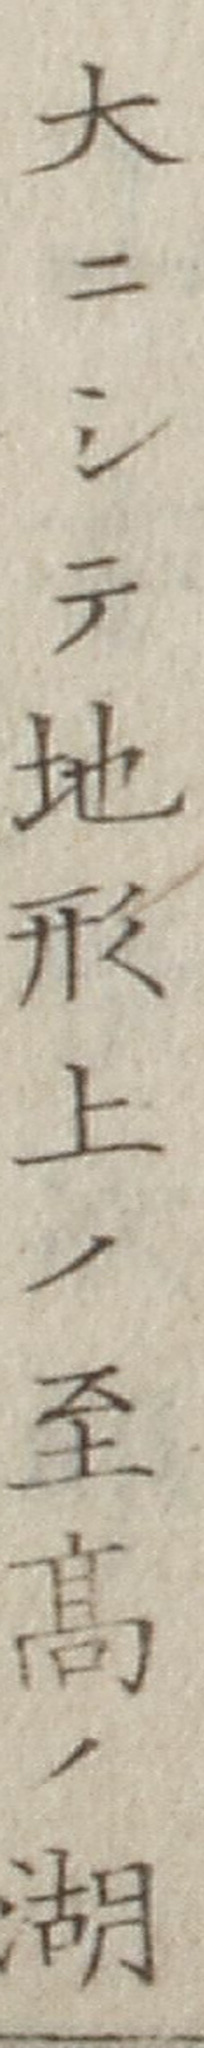大ニシテ地形上ノ至高ノ湖
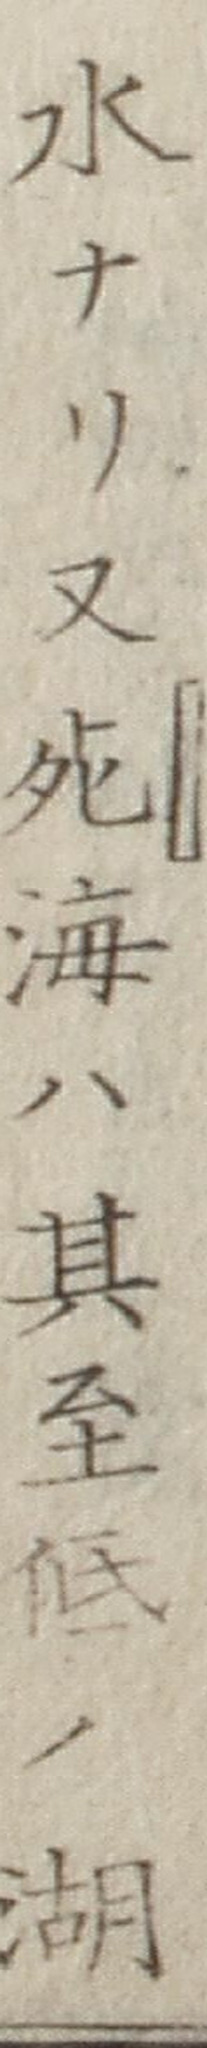水ナリ又死海ハ其至低ノ湖
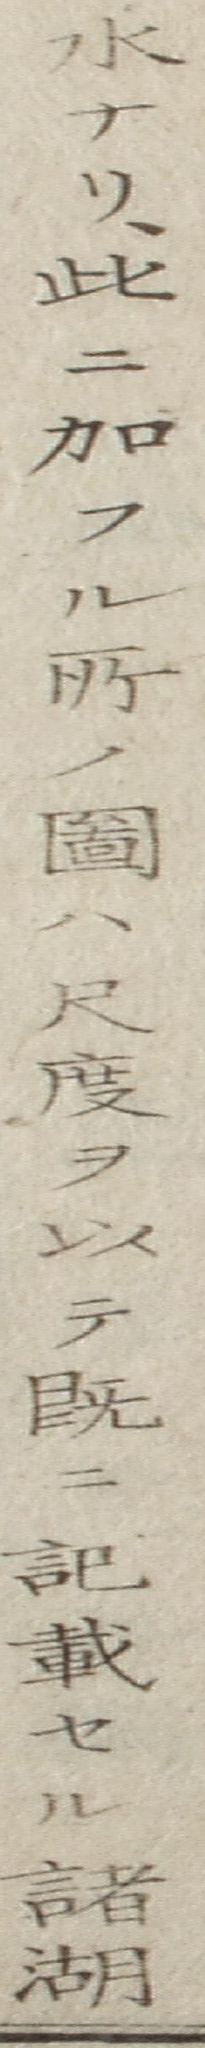水ナリ、此ニ加フル所ノ図ハ尺度ヲ以テ既ニ記載セル諸湖
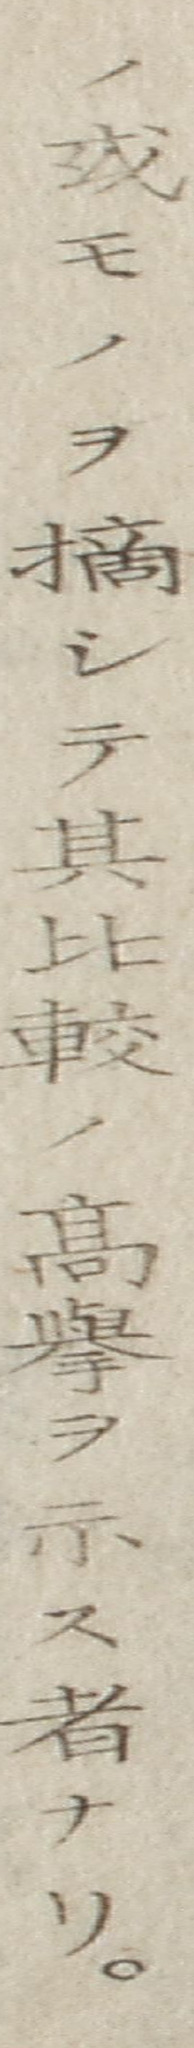ノ或モノヲ摘シテ其比較ノ高挙ヲ示ス者ナリ。
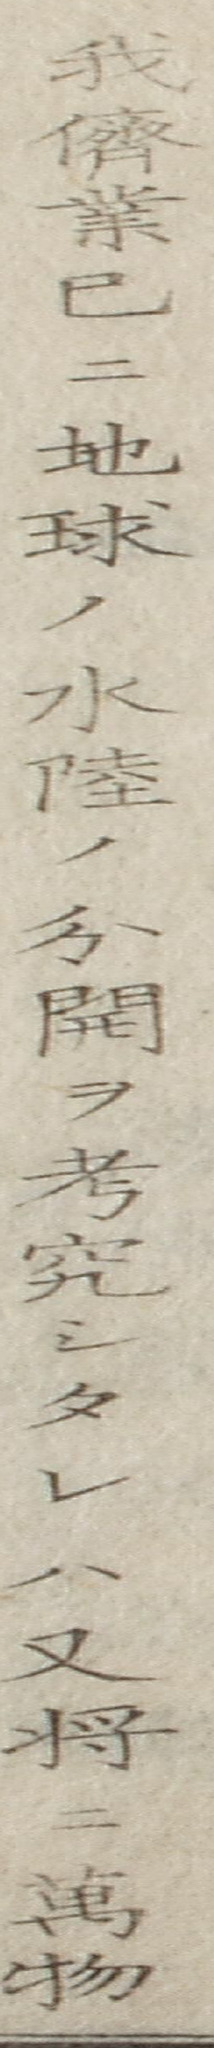我儕業巳ニ地球ノ水陸ノ分開ヲ考究シタレハ又将ニ萬物
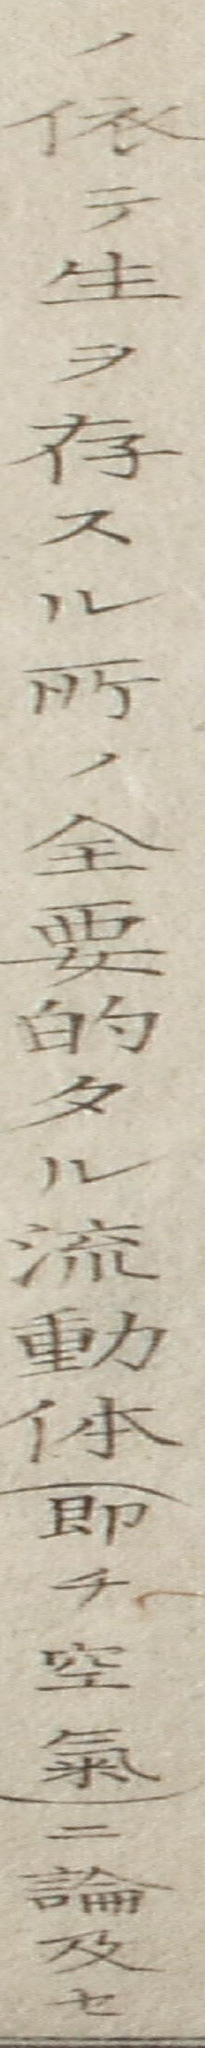ノ依テ生ヲ存スル所ノ全要的タル流動体ニ論及セ
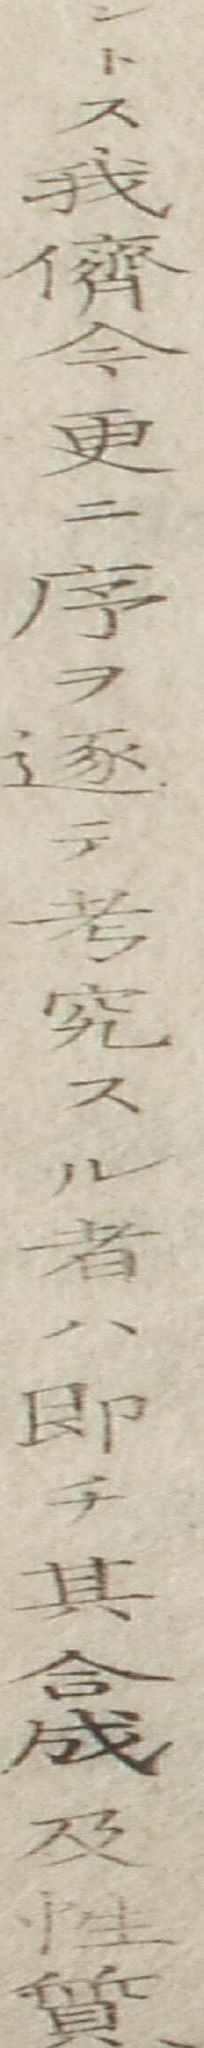ントス我儕今更ニ序ヲ遂テ考究スル者ハ即チ其合成及性質、
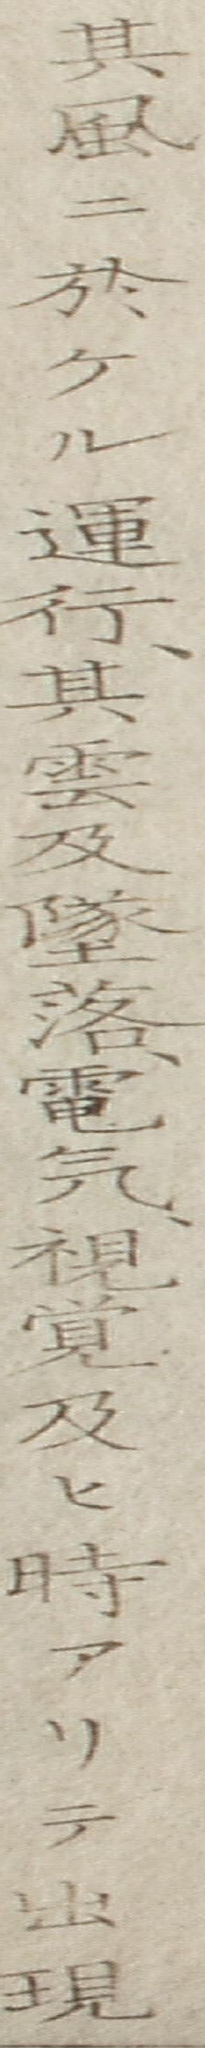其風ニ於ケル運行、其雲及墜落、電気、視覚及ヒ時アリテ出現
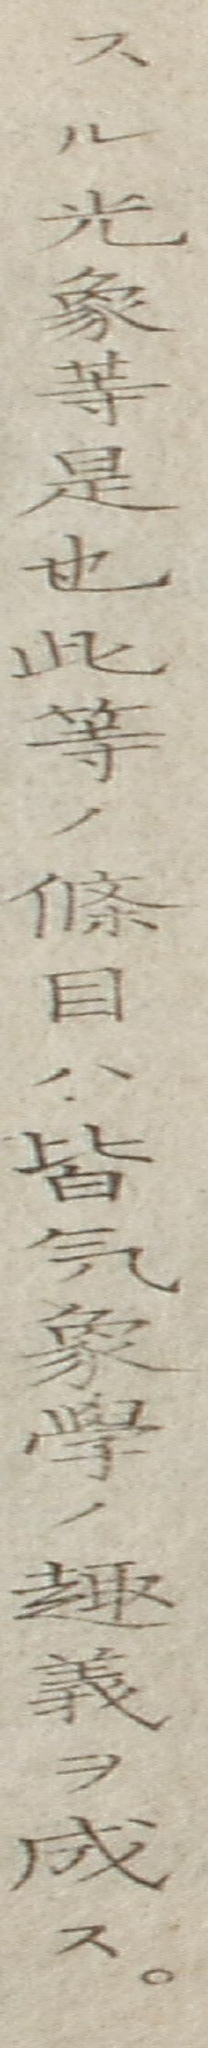スル光象等是也此等ノ儕目ハ皆気象学ノ趣義ヲ成ス。

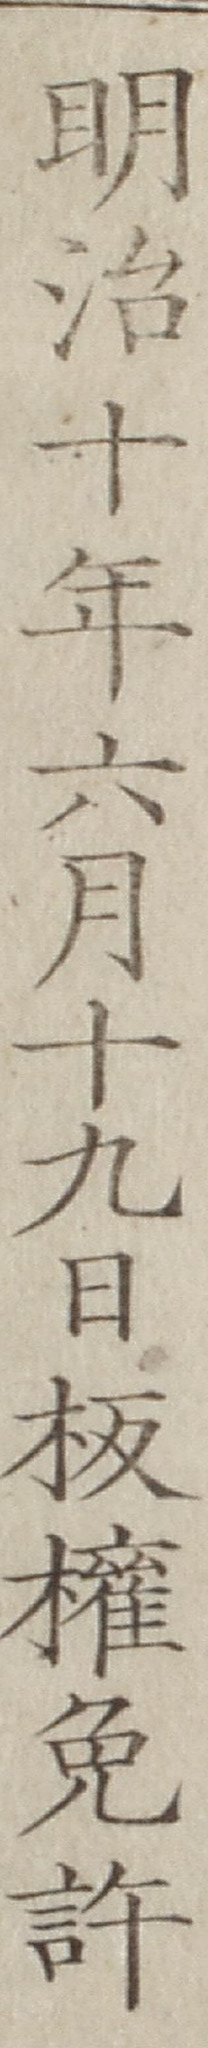明治十年六月十九日板権免許
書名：地形論　巻二
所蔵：東京大学地震研究所図書室 Earthquake Research Institute Library, The University of Tokyo, JAPAN
